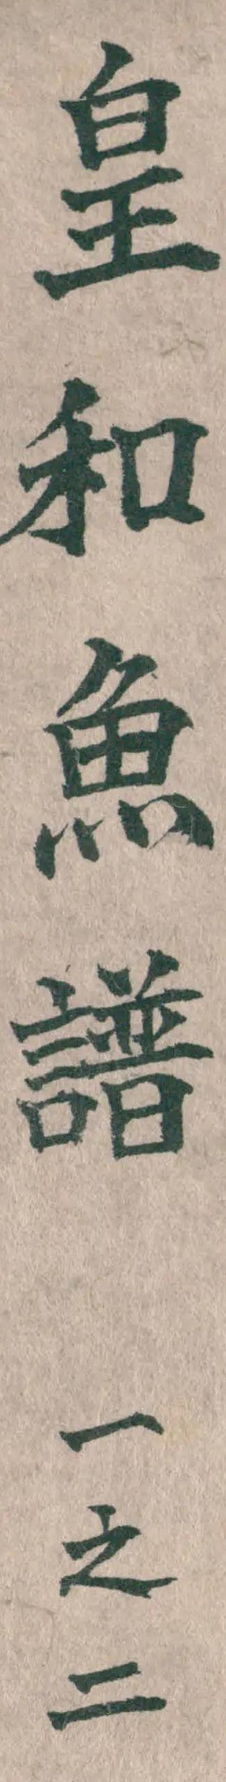皇和魚譜一之二

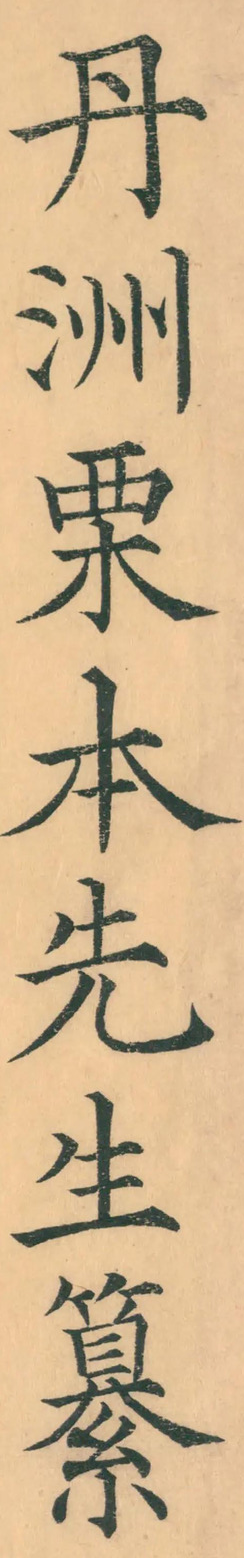丹洲栗本先生纂
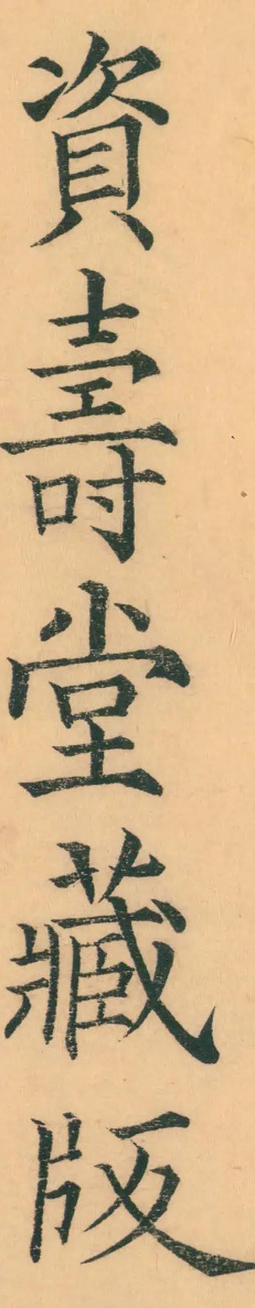資寿堂蔵版
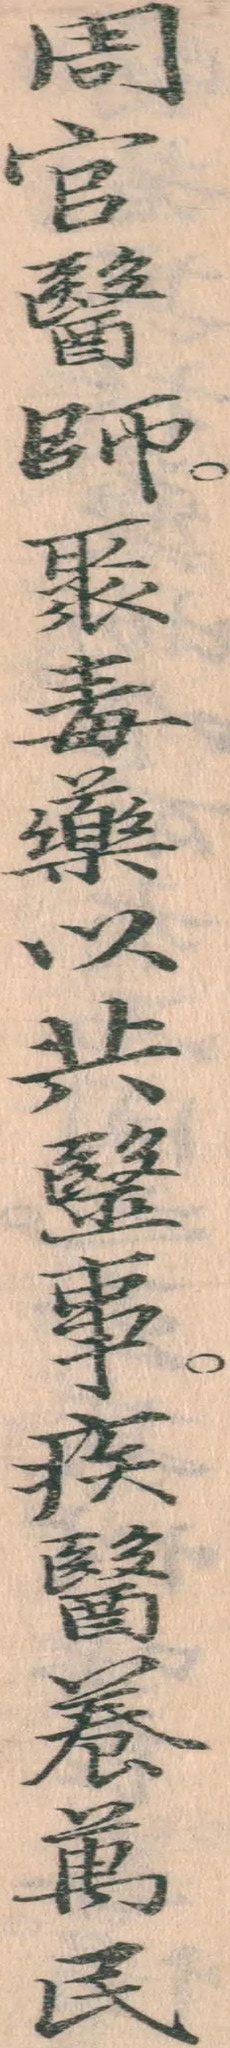周官医師。聚毒薬以共医事。疾医養万民
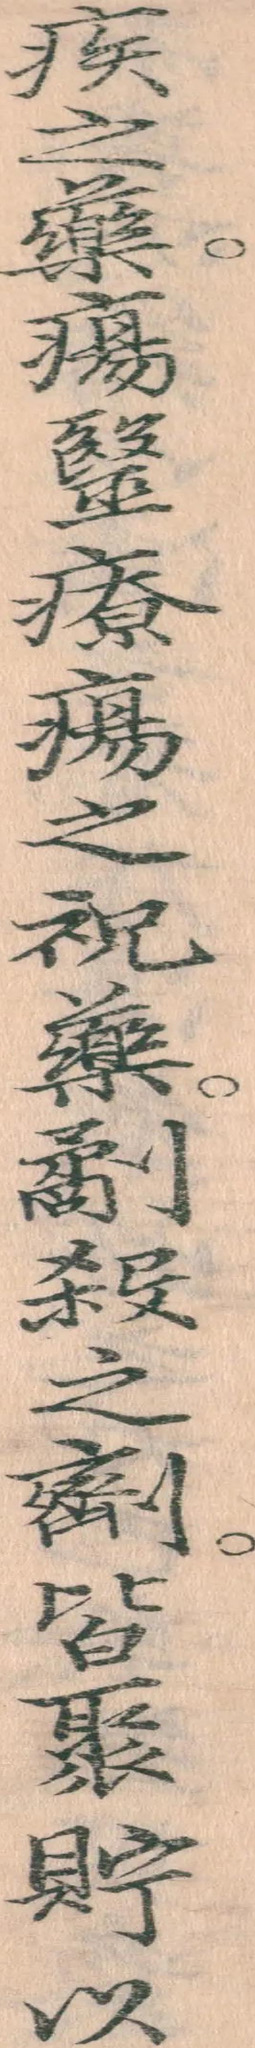疾之薬。瘍医療瘍之祝薬。劀殺之剤。皆聚貯以
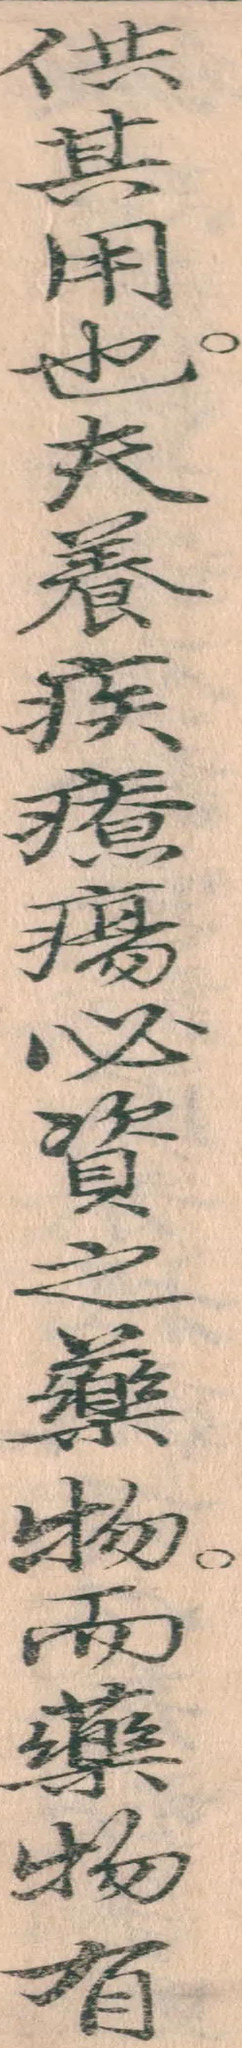供其用也。夫養疾療瘍必資之薬物。而薬物有
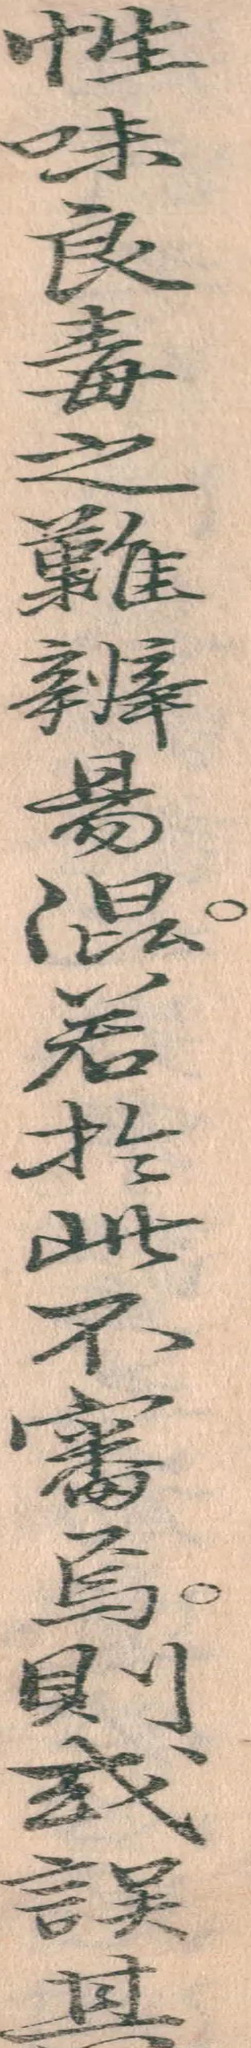性味良毒之難弁易混。若於此不審焉。則或誤其
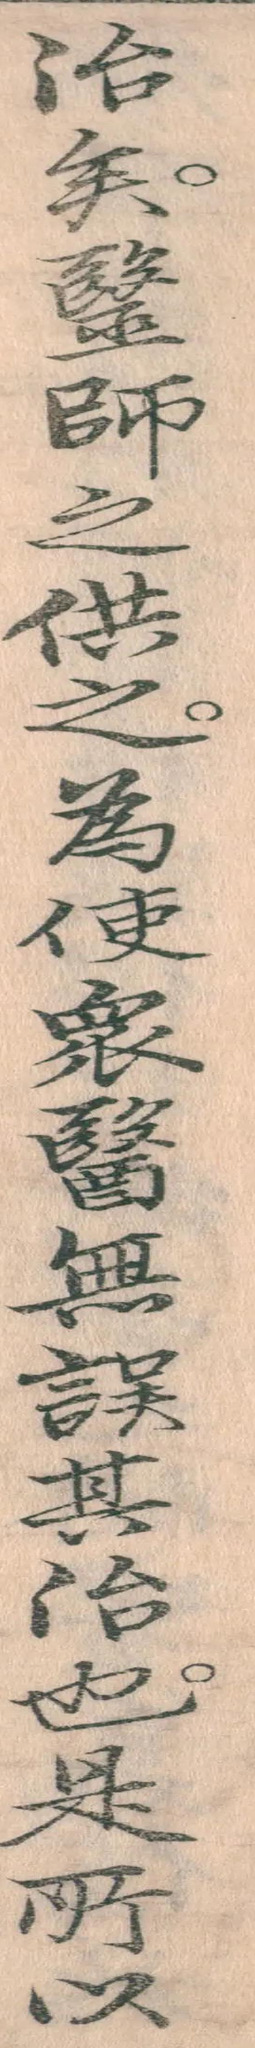治矣。医師之供之。為使衆医無誤其治也。是所以
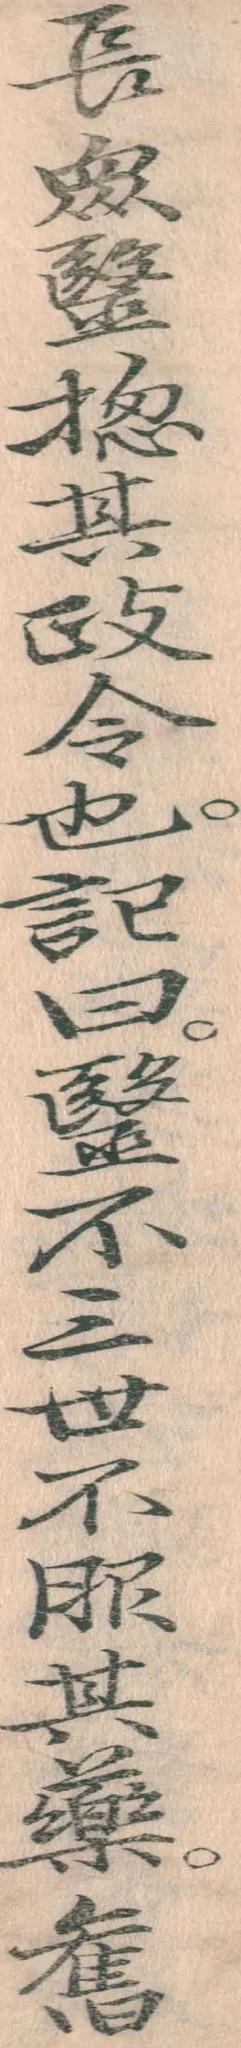長衆医揔其政令也。記曰。医不三世不服其薬。旧
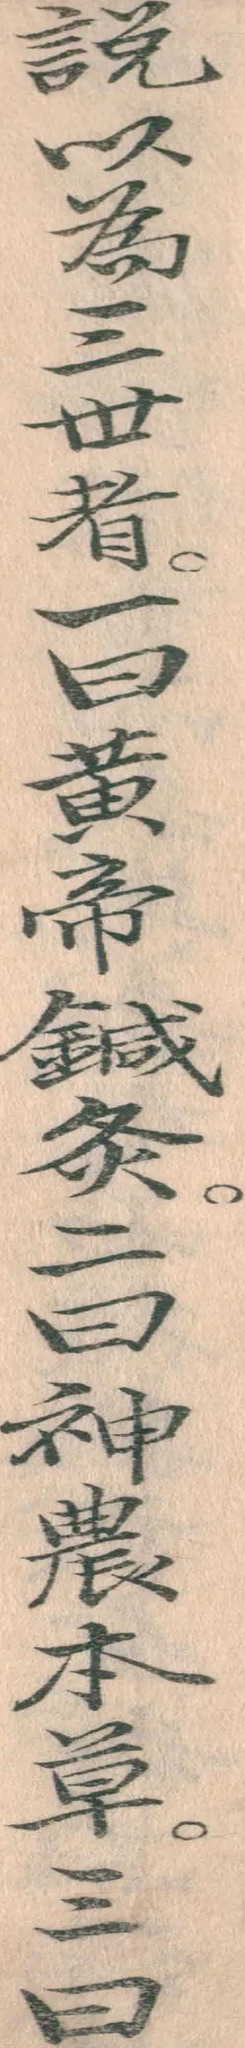説以為三世者。一曰黄帝鍼灸。二曰神農本草。三曰
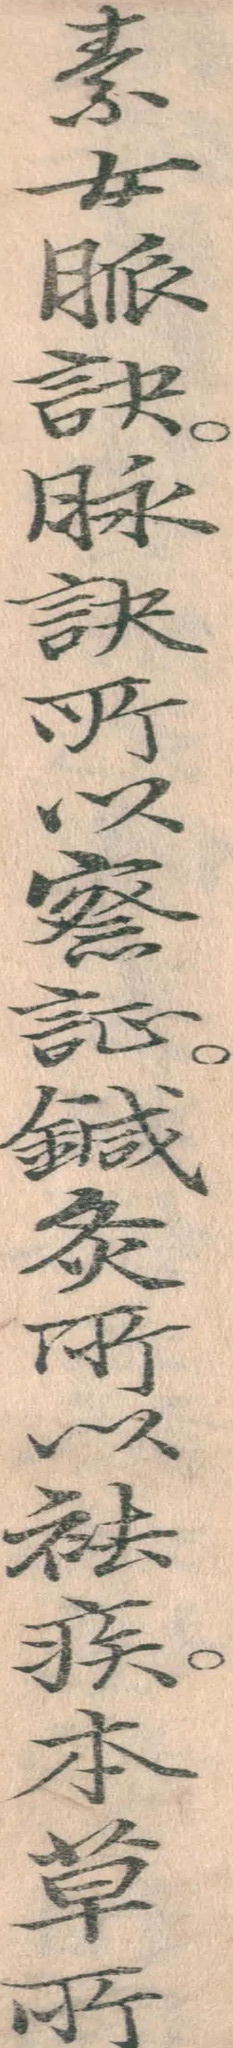素女脈訣。脈訣所以察証。鍼灸所以袪疾。本草所
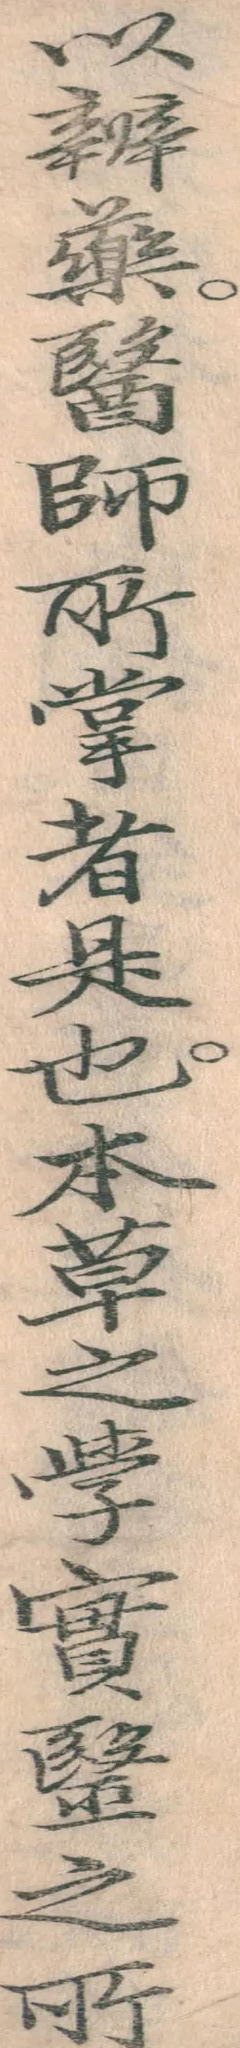以弁薬。医師所掌者是也。本草之学実医之所
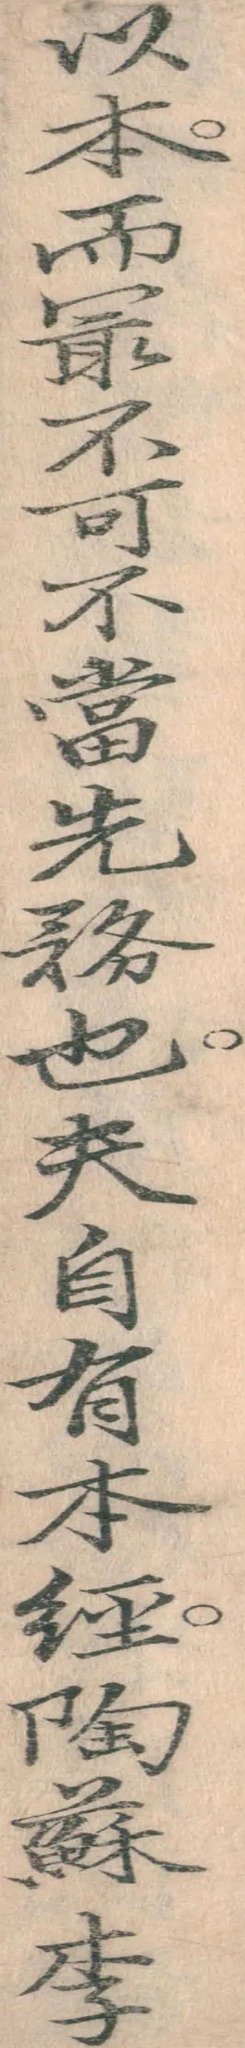以本。而最不可不当先務也。夫自有本経。陶蘇李

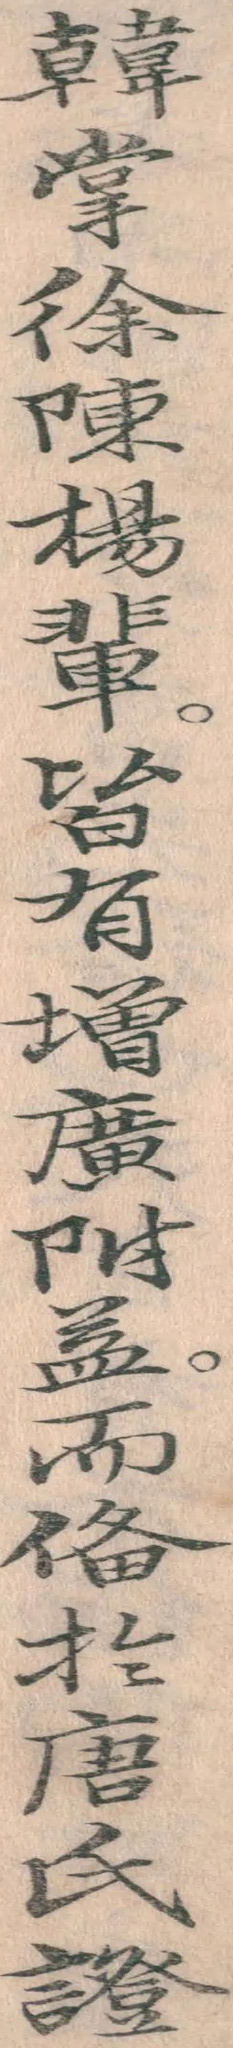韓掌徐陳楊輩。皆有増広附蓋。而備於唐氏証
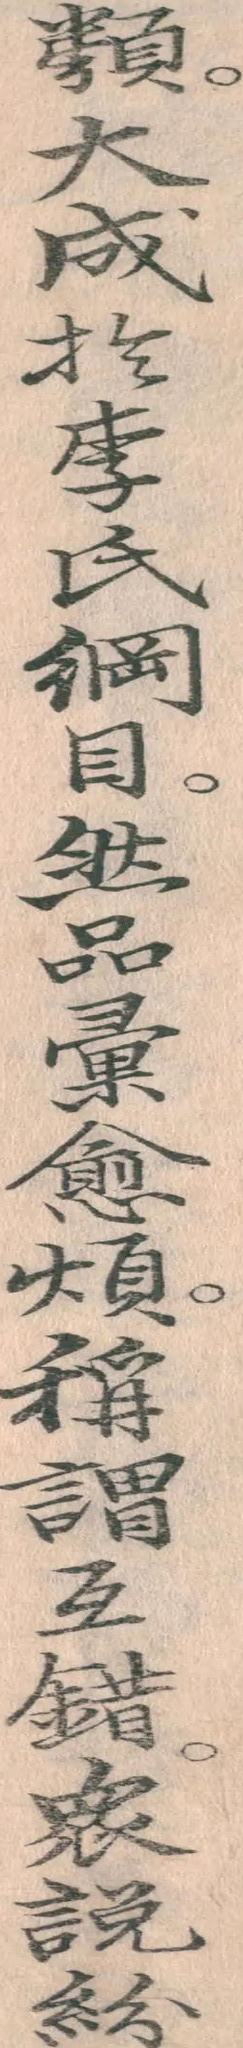類。大成於李氏綱目。然品彙愈煩。称謂互錯。衆説紛
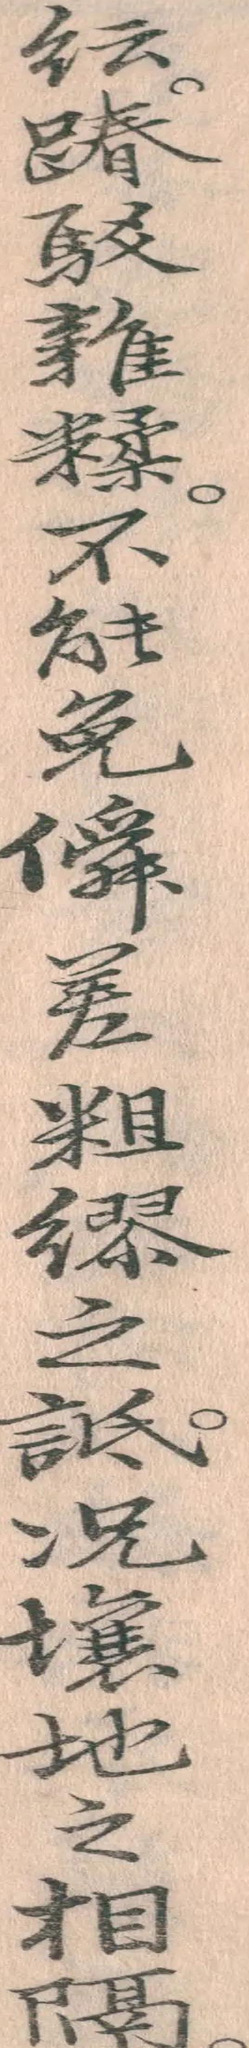紜。踳駁雑糅。不能免僢差粗繆之詆。況壌地之相隔。
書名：皇和魚譜 2巻
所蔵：国立国会図書館 National Diet Library, JAPAN
